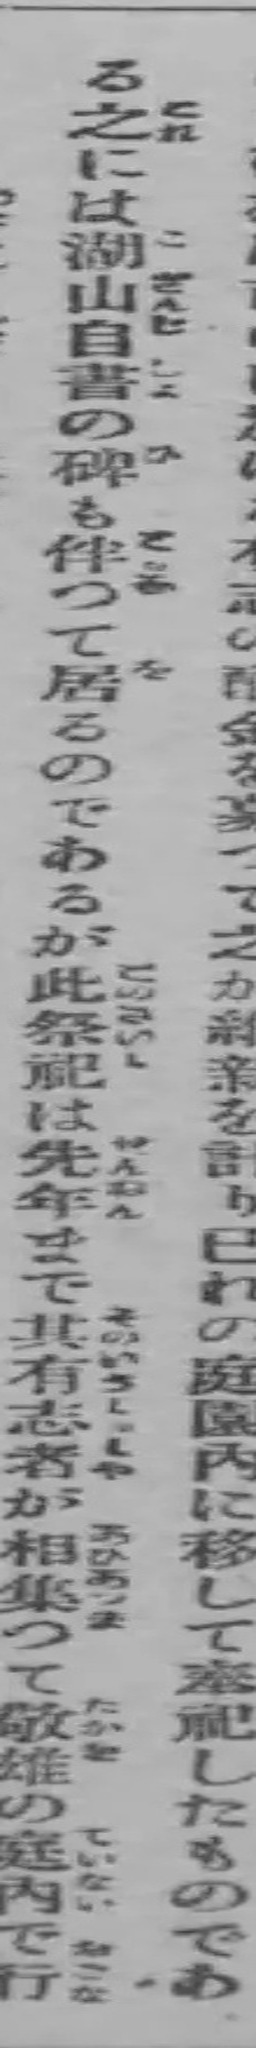る之には湖山自書の碑も伴つて居るのであるが此祭祀は先年まで其有志者が相集つて敬雄の庭内で行
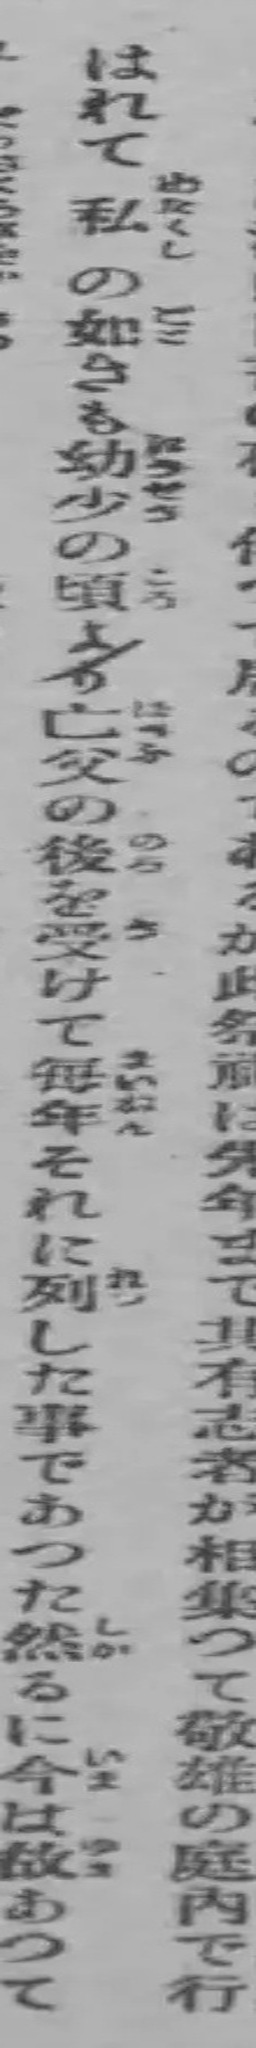はれて私の如きも幼少の頃より亡父の後を受けて毎年それに列した事であつた然るに今は故あつて
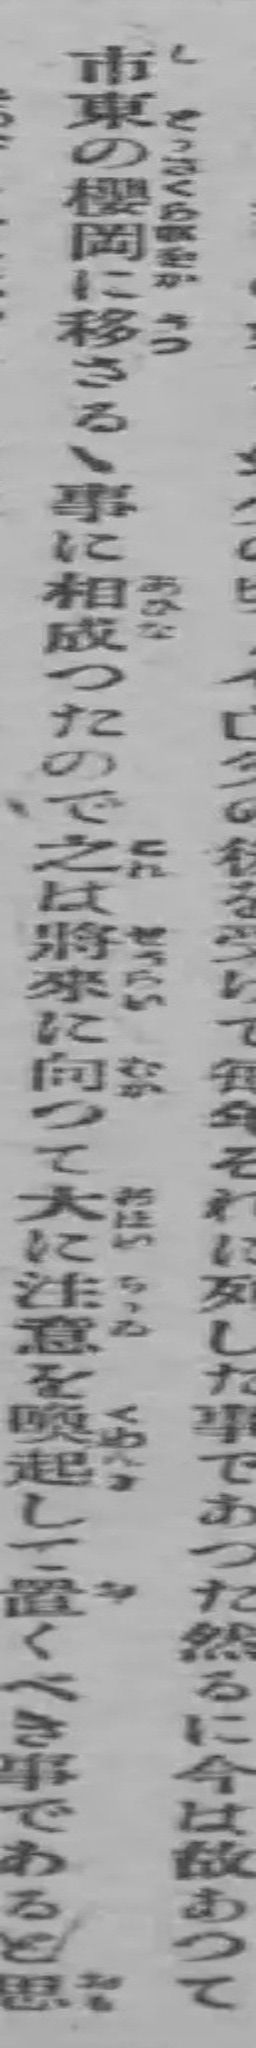市東の桜岡に移さるゝ事に相成つたので之は将来に向つて大に注意を喚起して置くべき事であると思
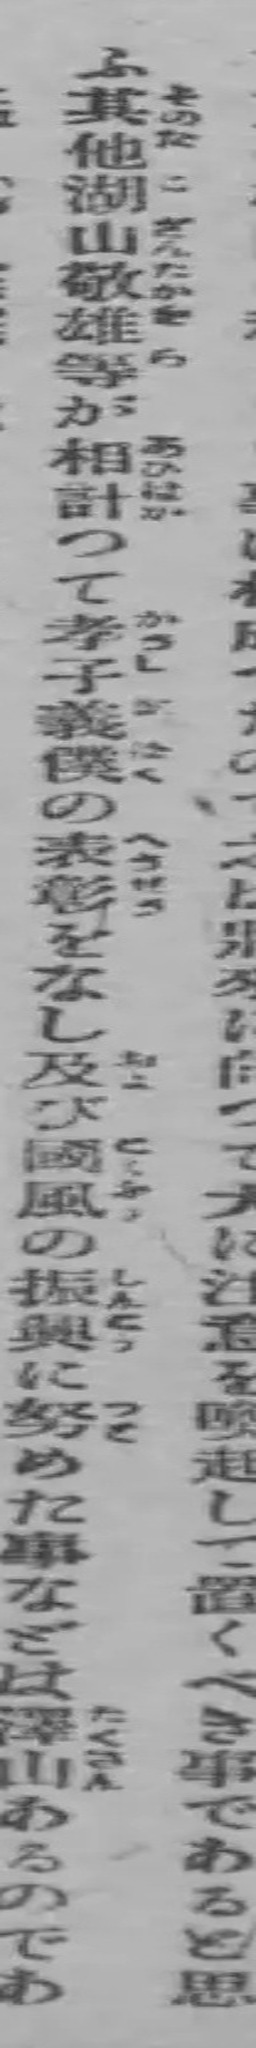ふ其他湖山敬雄等が相計つて孝子義僕の表彰をなし及び国風の振興に努めた事などは沢山あるのであ
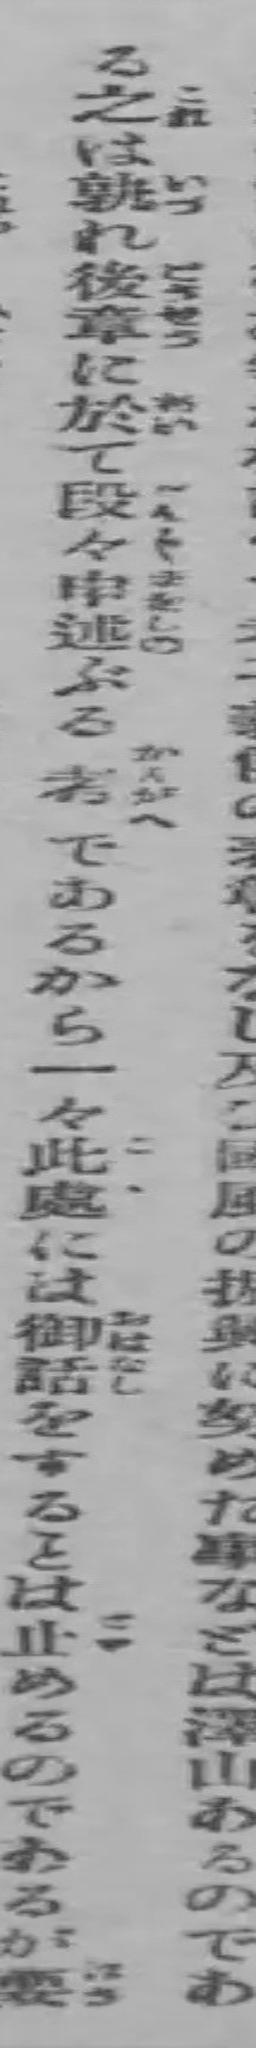る之は孰れ後章に於て段々申述ぶる考であるから一々此処には御話をすることは止めるのであるが要
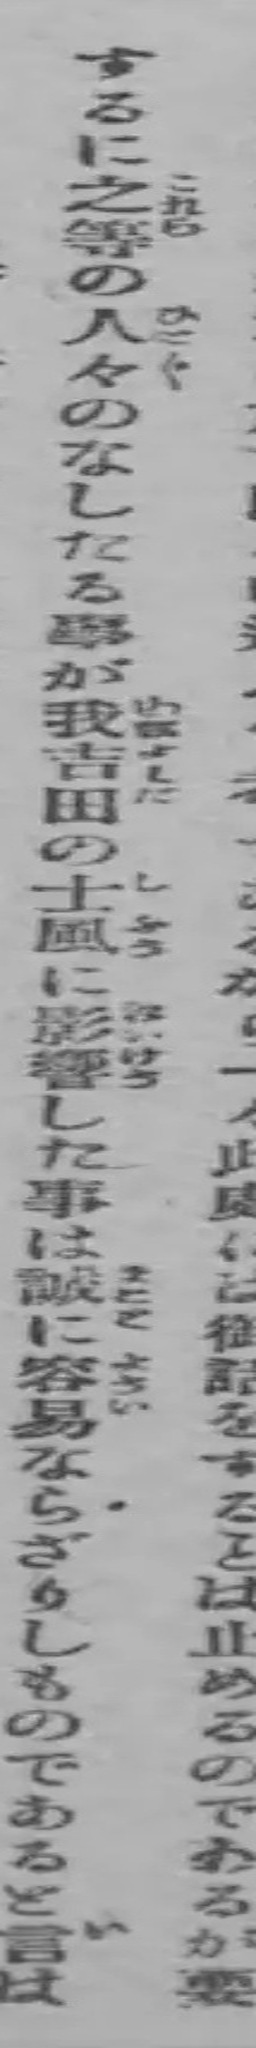するに之等の人々のなしたる事が我吉田の士風に影響した事は誠に容易ならざりしものであると言は
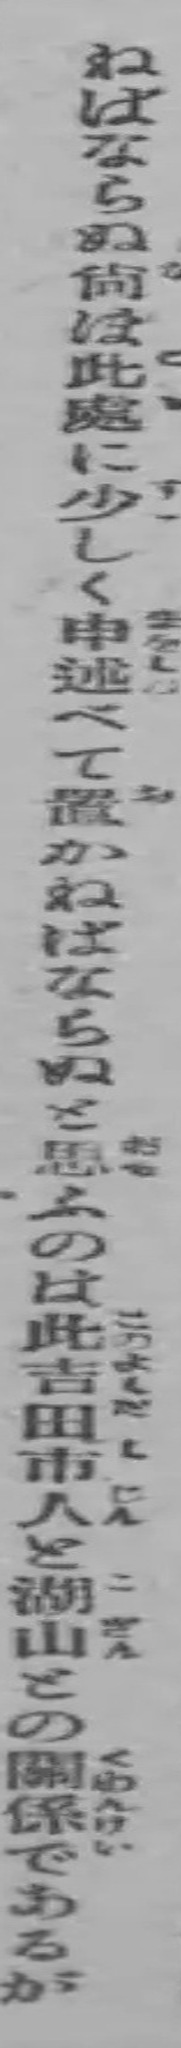ねばならぬ尚ほ此処に少しく申述べて置かねばならぬと思ふのは此吉田市人と湖山との関係であるが
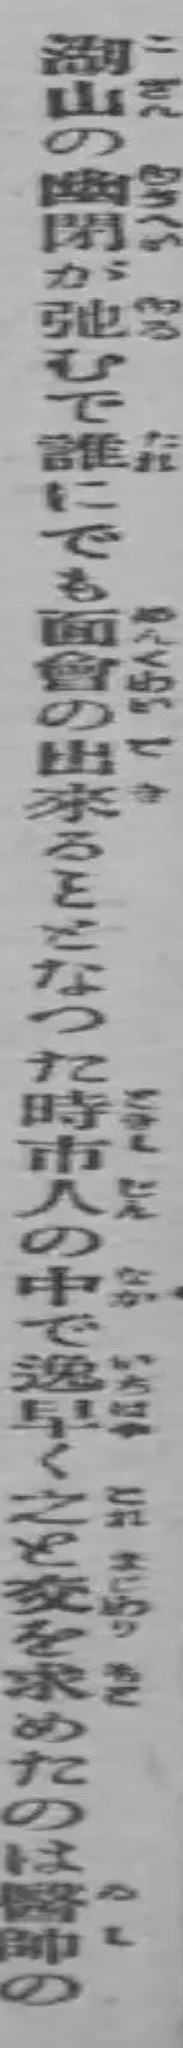湖山の幽閉が弛むで誰にでも面会の出来ることとなつた時市人の中で逸早く之と交を求めたのは医師の
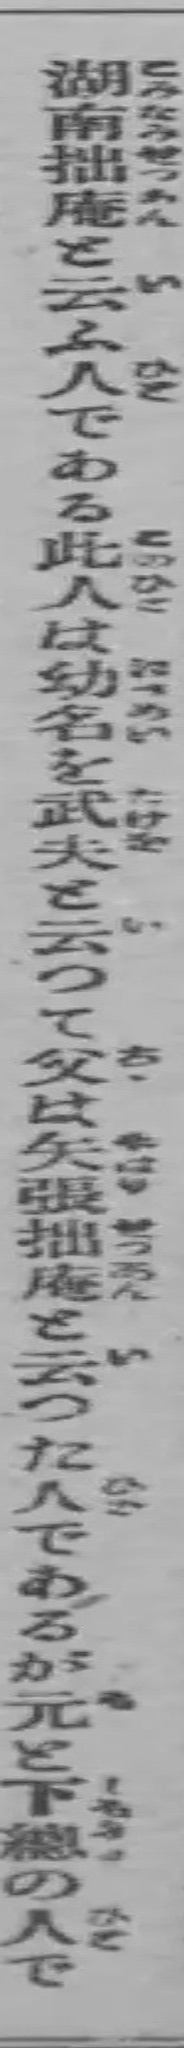湖南拙庵湖南拙庵と云ふ人である此人は幼名を武夫と云つて父は矢張拙庵と云つた人であるが元と下総の人で
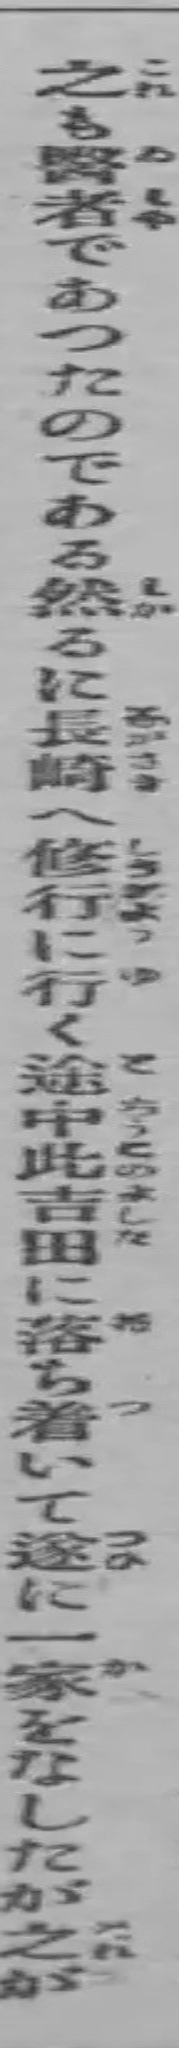之も医者であつたのである然るに長崎へ修行に行く途中此吉田に落ち着いて遂に一家をなしたが之が
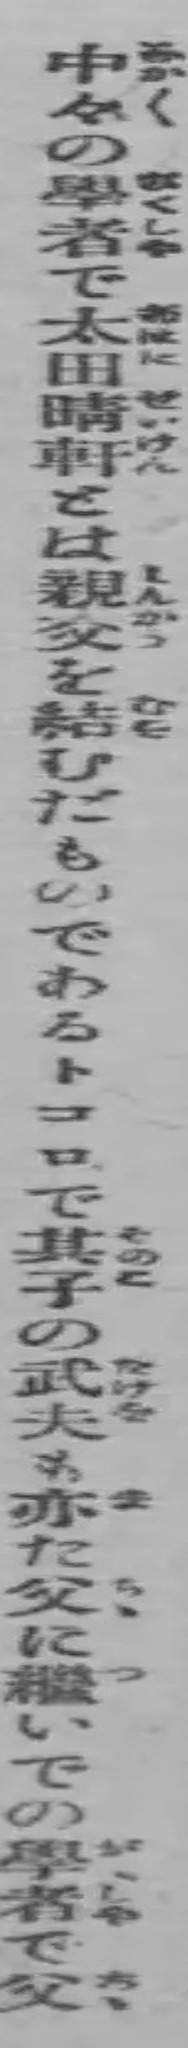中々の学者で太田晴軒とは親交を結むだものであるトコロで其子の武夫も亦た父に継いでの学者で父
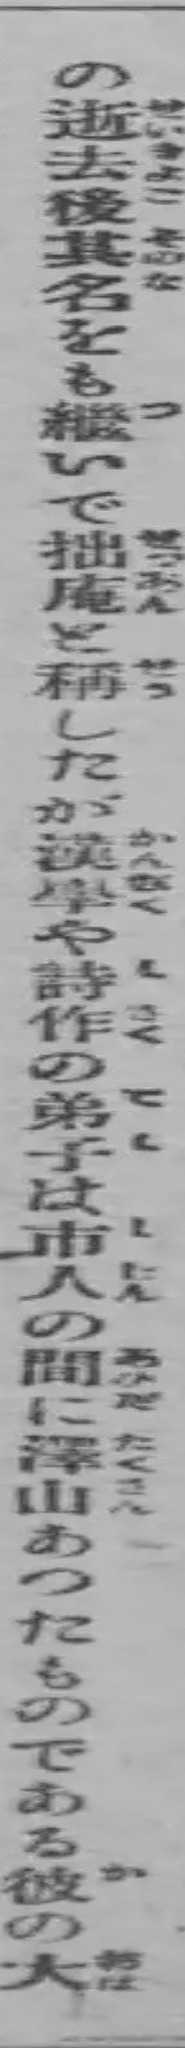の逝去後其名をも継いで拙庵と称したが漢学や詩作の弟子は市人の間に沢山あつたものである彼の大
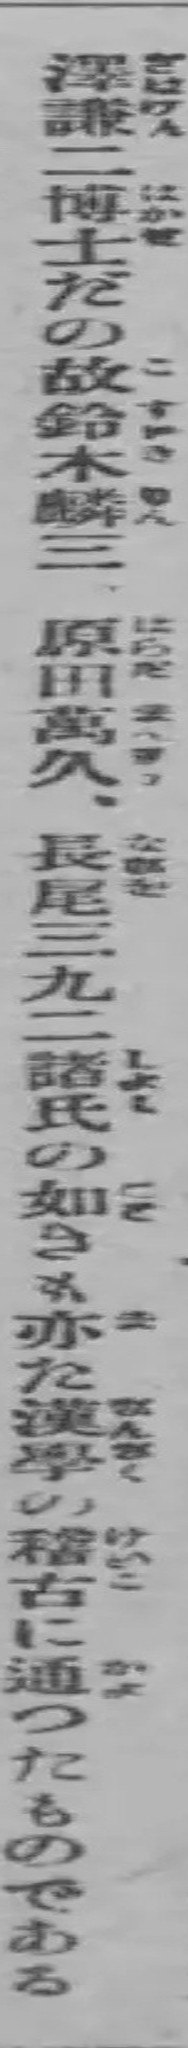澤賢二博士だの故鈴木麟三、原田萬久、長尾三九二諸氏の如きも亦た漢学の稽古に通つたものである
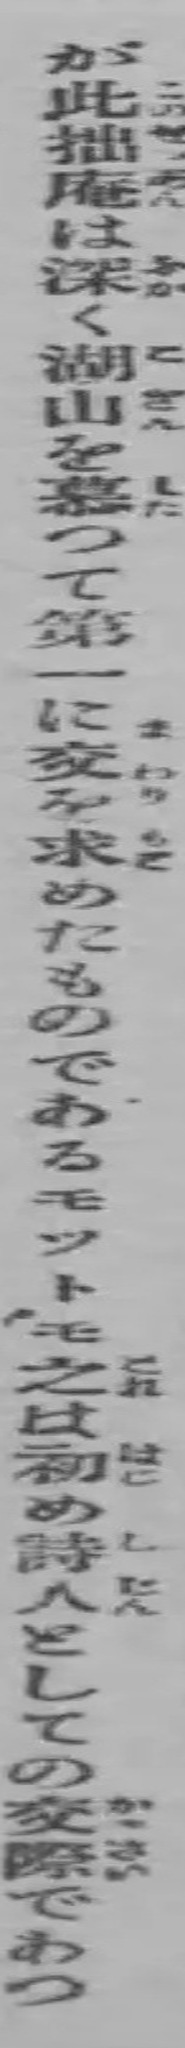が此拙庵は深く湖山を慕つて第一にも交を求めたものであるモツトモ之は初め詩人としての交際であつ
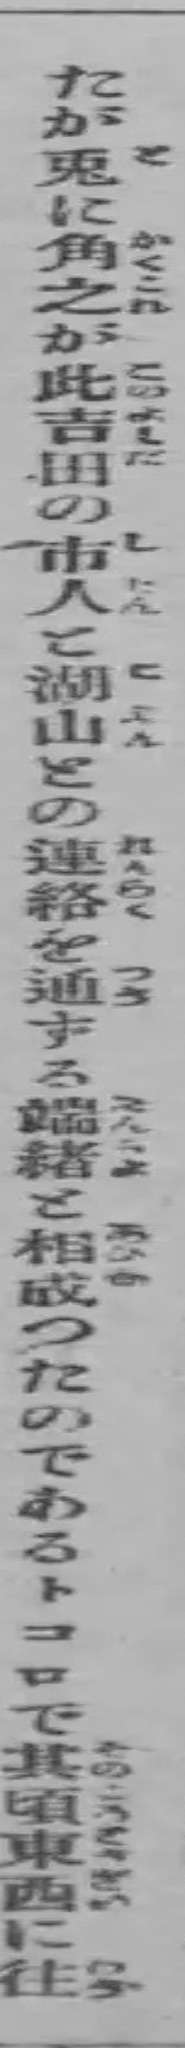たが兎に角之が此吉田の市人と湖山との連絡を通ずる端緒と相成つたのであるトコロで其頃東西に往
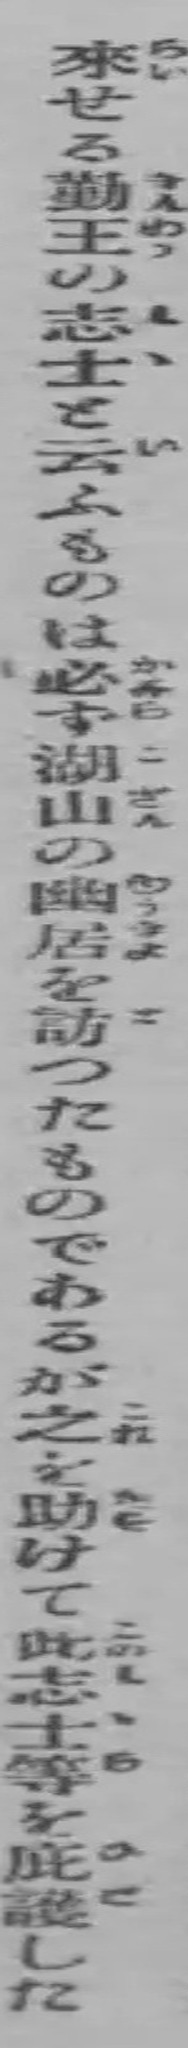来せる勤王の志士と云ふものは必ず湖山の幽居を訪つたものであるが之を助けて此志士等を庇護した
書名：豊橋市史談
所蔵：国立国会図書館 National Diet Library, JAPAN
